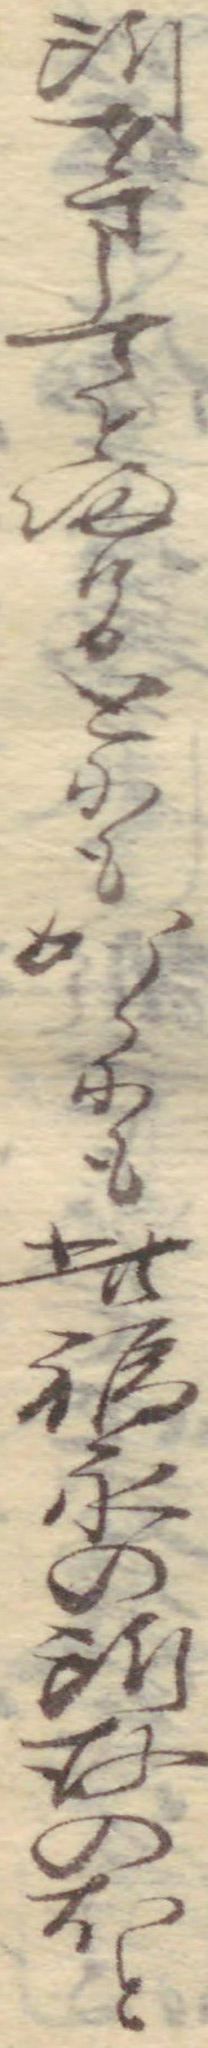所をさしてそ帰けるとにもかくにも此福永の所存のほと
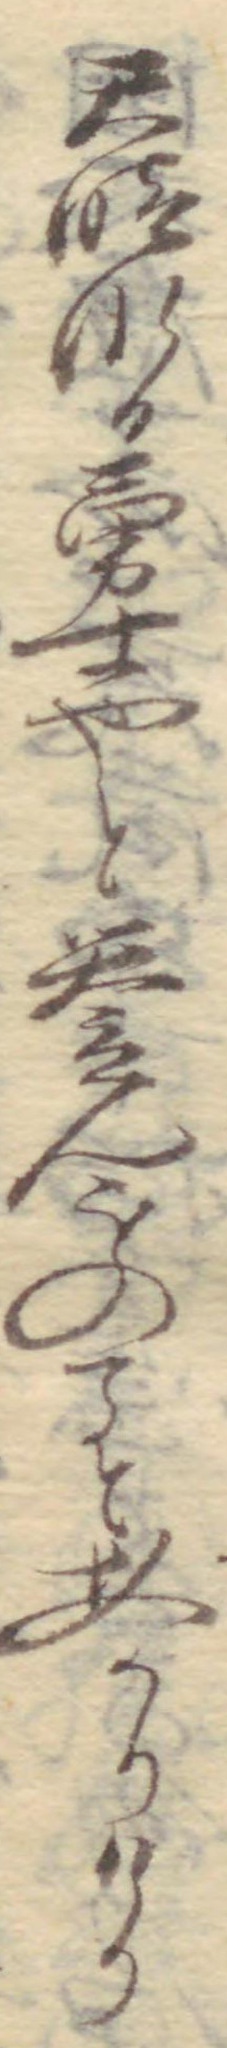天晴なる勇士やと誉んものこそなかりけり
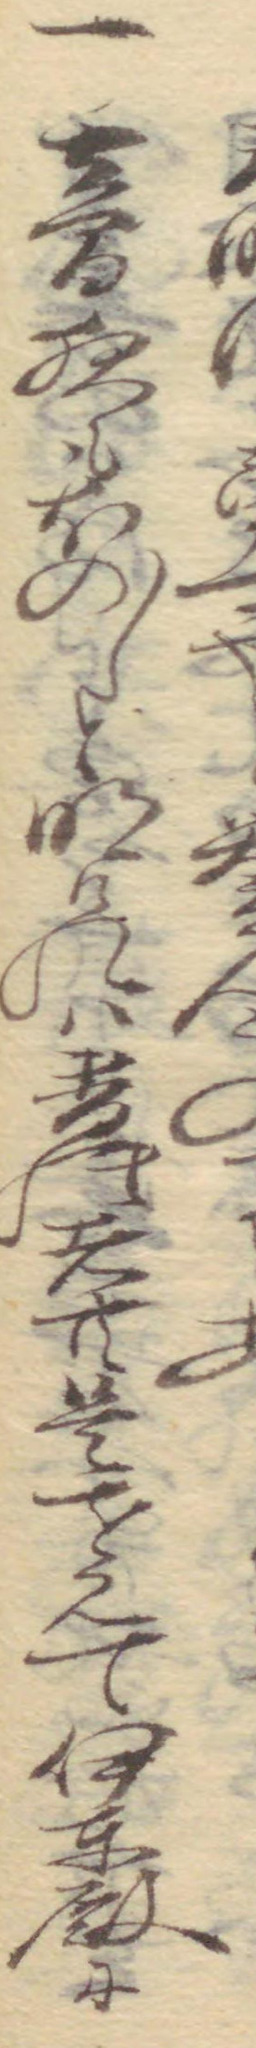一去間夜もほの〳〵と明けれは番の者共是を見て伊東殿に
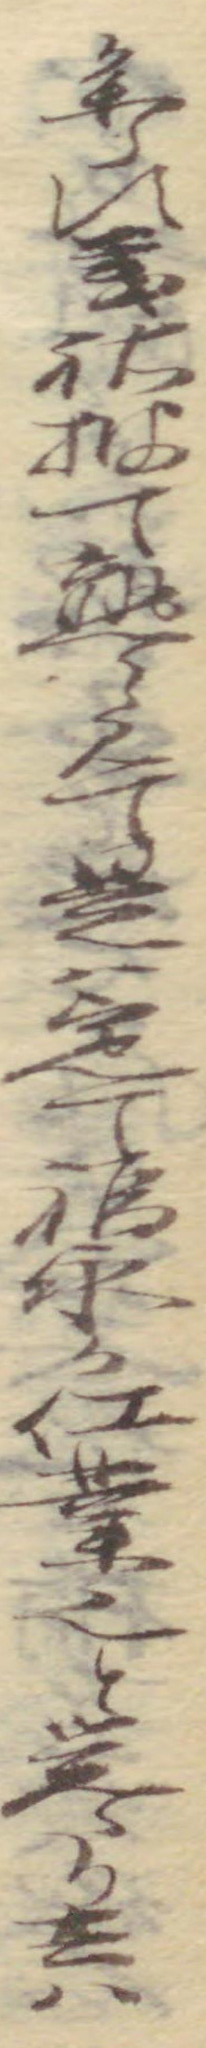参らす義祐披て熟々見て是は定て福永か仕業也と覚たり去は
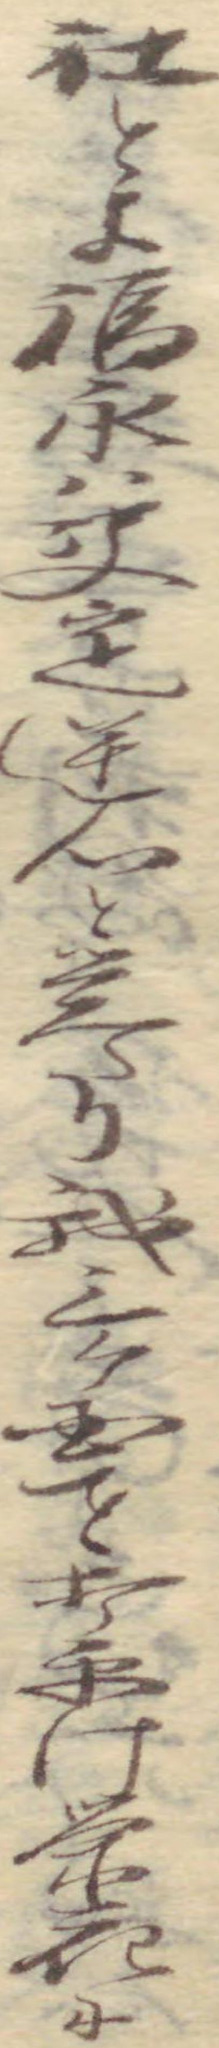社とよ福永は決定逆心と覚たり我三ケ国を打平け栄花に
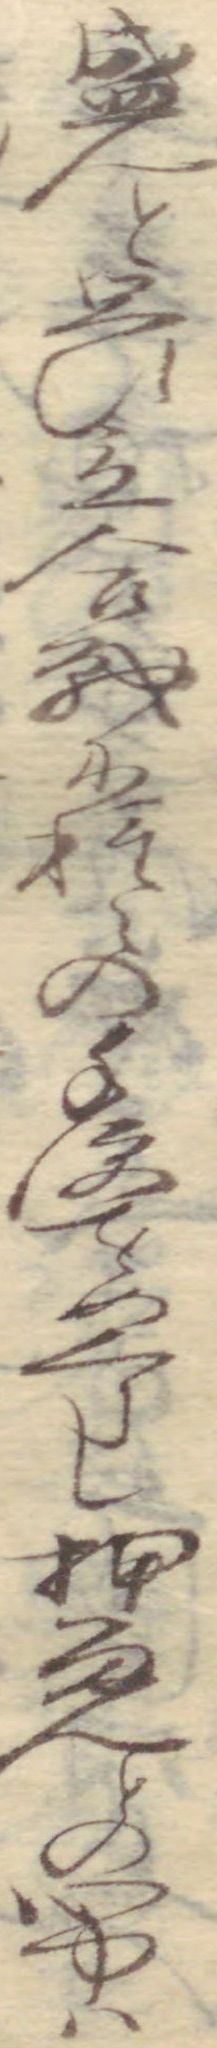盛んと思ひ立合戦に種々の手便をめくらし押留んとの心中は
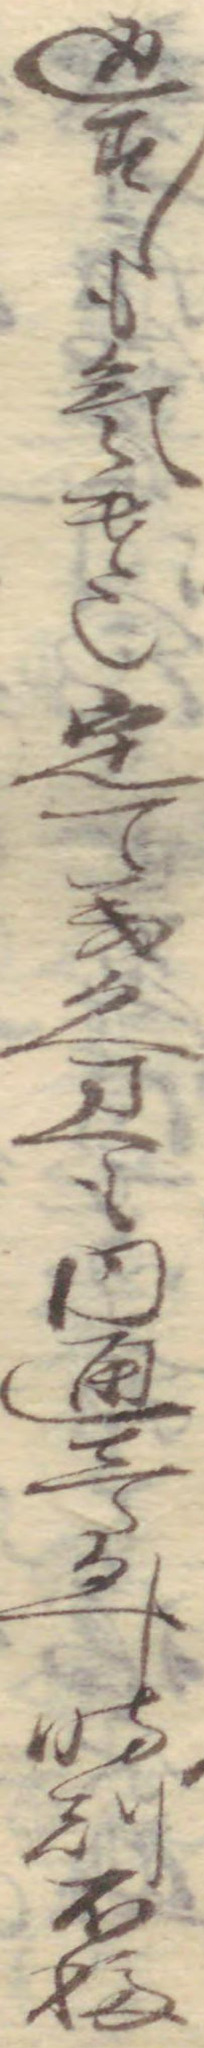返す〳〵も気遣也定て義久方へも内通したるへし時刻不移
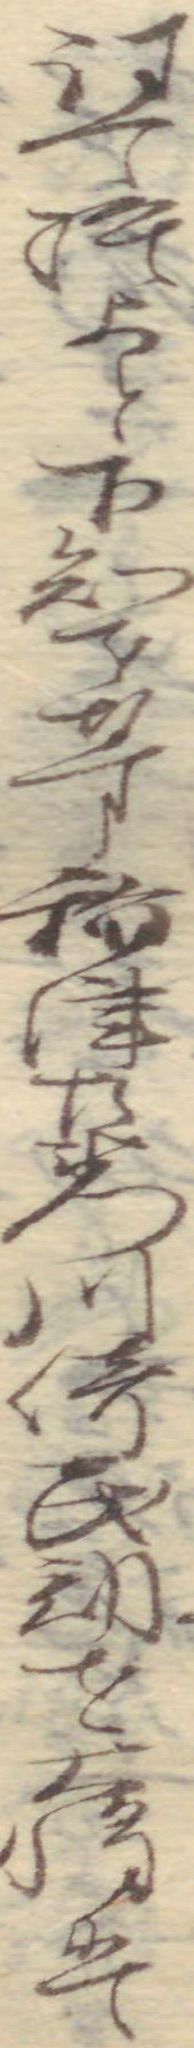討て捨よと下知をなす稲津左衛門川崎民部を大将にて
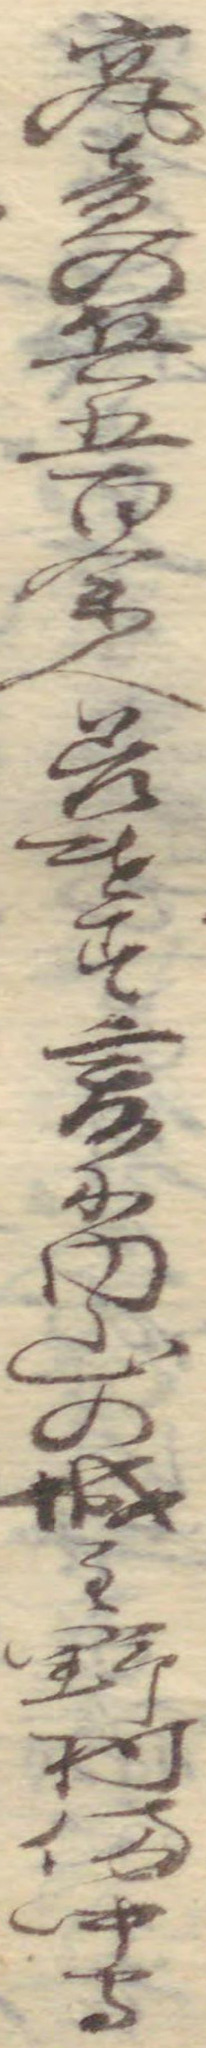究竟の兵五百余人差遣す爰に内山の城主野村備中守
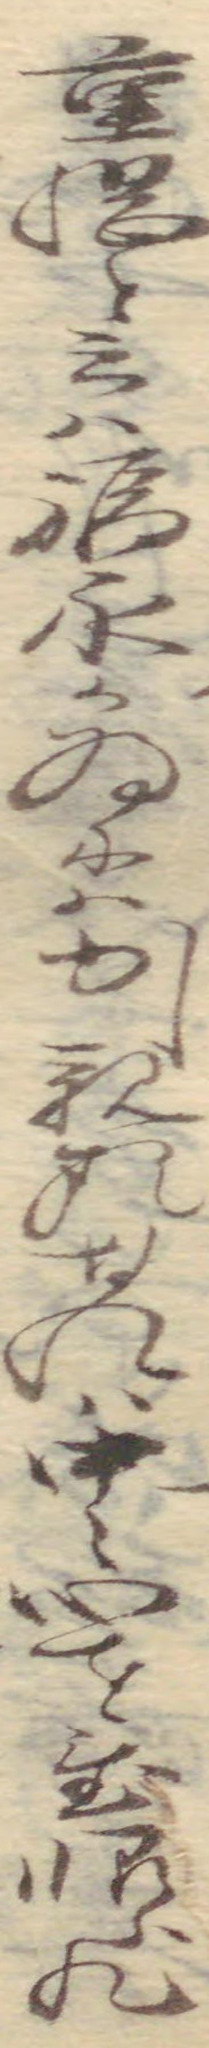重綱と云は福永か為には少し親類なれは中々心を置恨られ
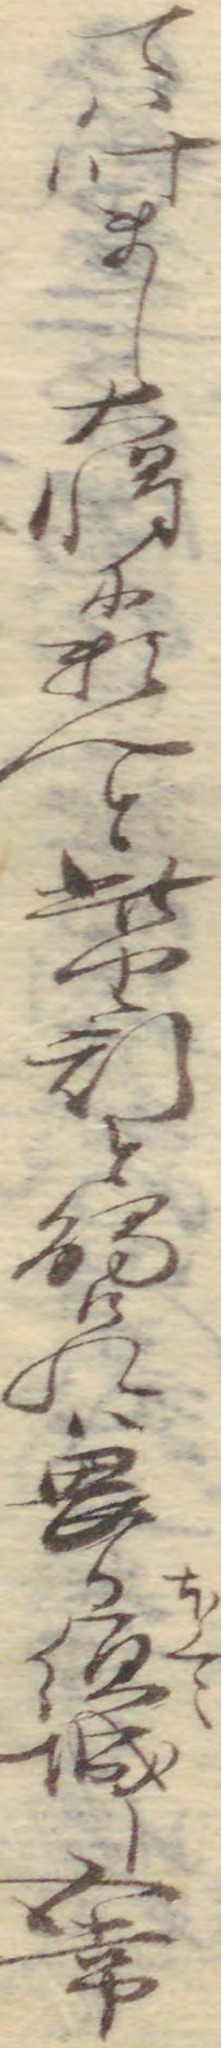ては叶まし大将に頼んと此由斯と触けれは畏り隠城し五常
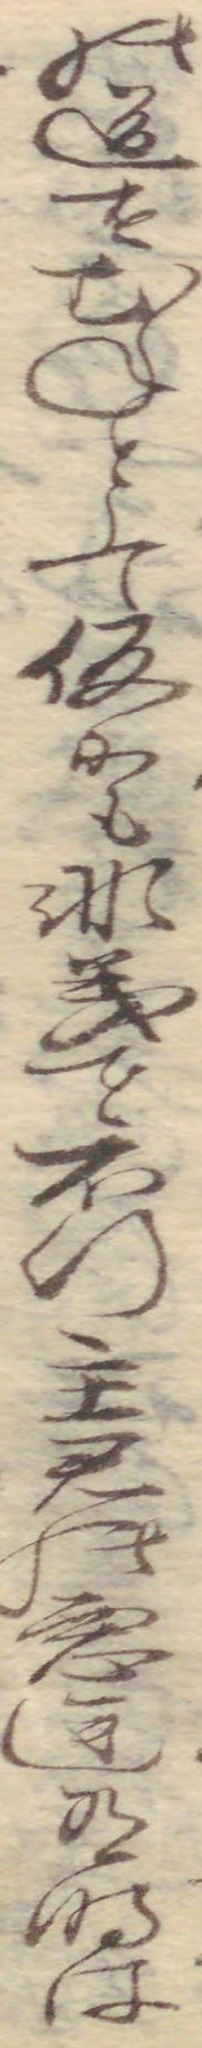の道をむねとして仮にも非義を不行主君の悪逆有時は
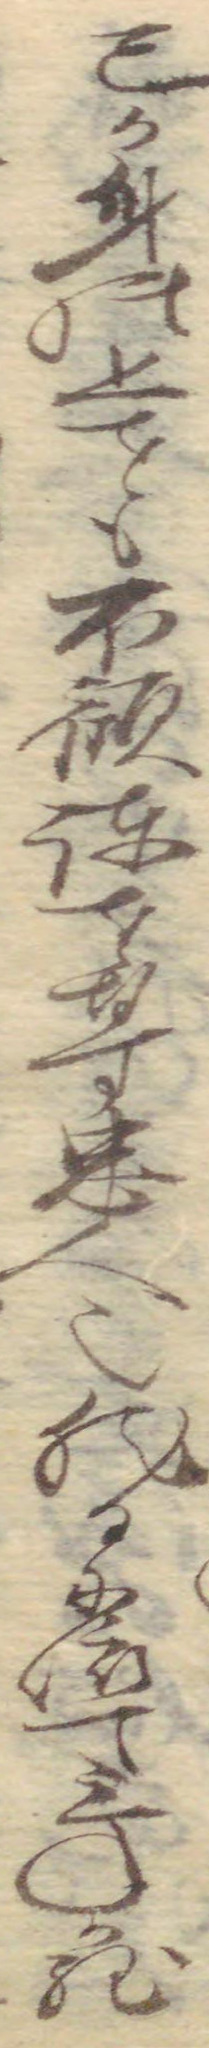己か身の上をも不顧諌をなす忠人也然るに依て三年か程
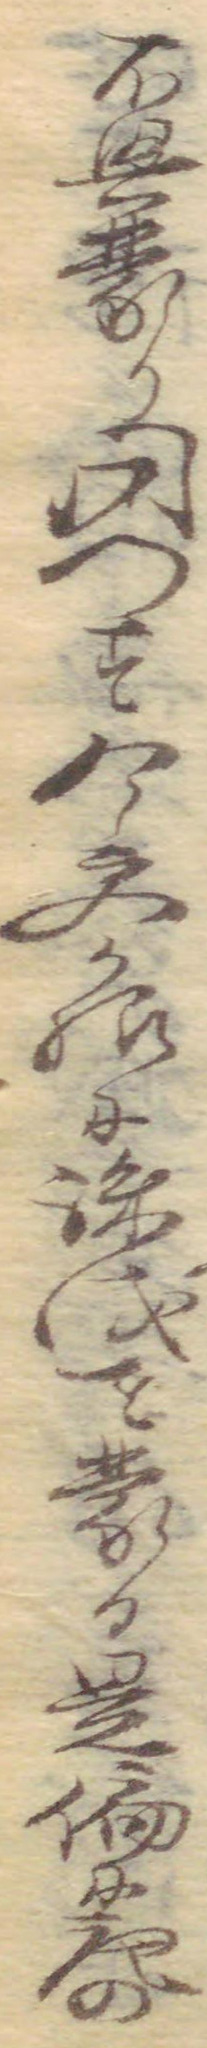不興蒙り閉門す今更か様に誅伐を蒙る是偏に唐の

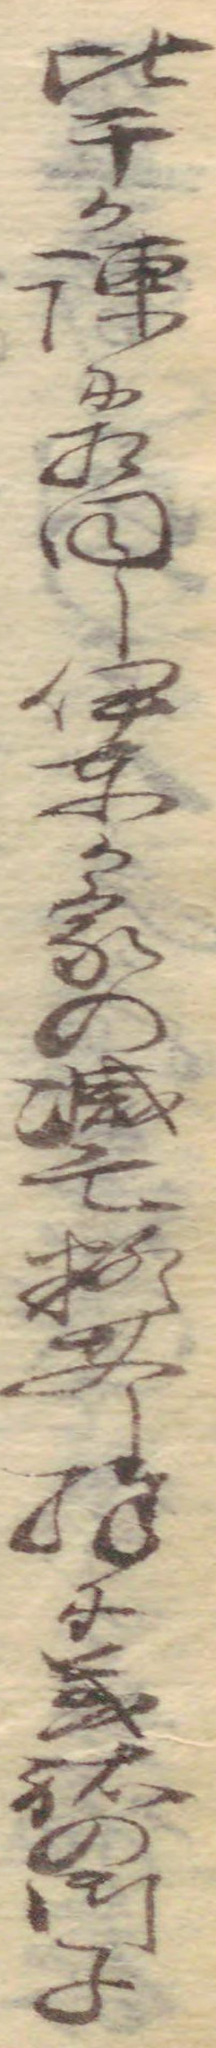比干か諌に相同し伊東か家の滅亡疑なし殊に義祐の御子
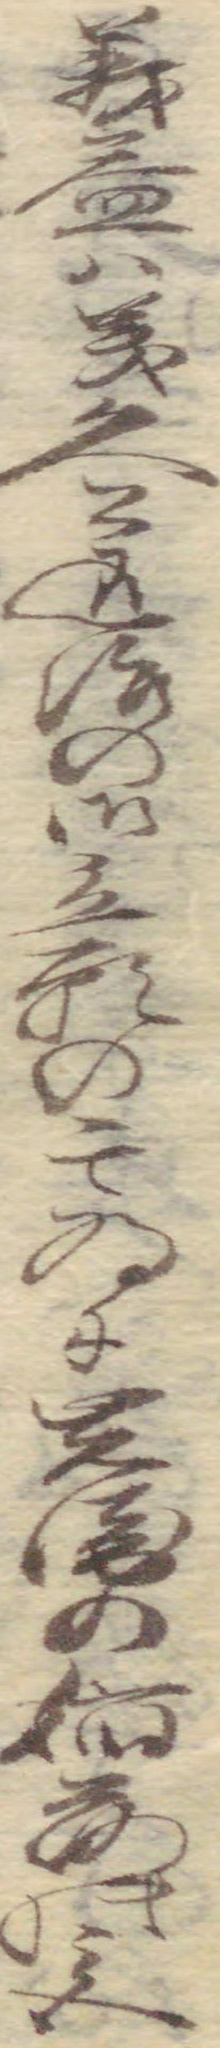義益は義久向退治の御立願の其為に岩崎の稲荷の宮
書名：鶯宿雑記. 巻199-200
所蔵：国立国会図書館 National Diet Library, JAPAN
